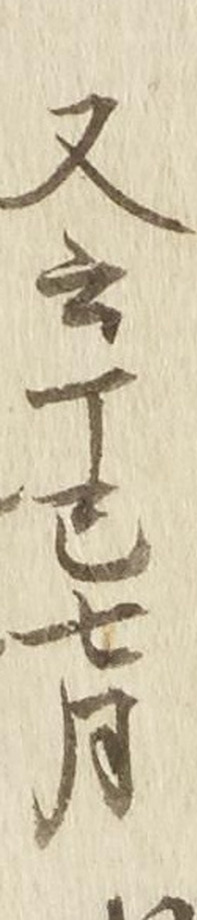又云丁巳七月
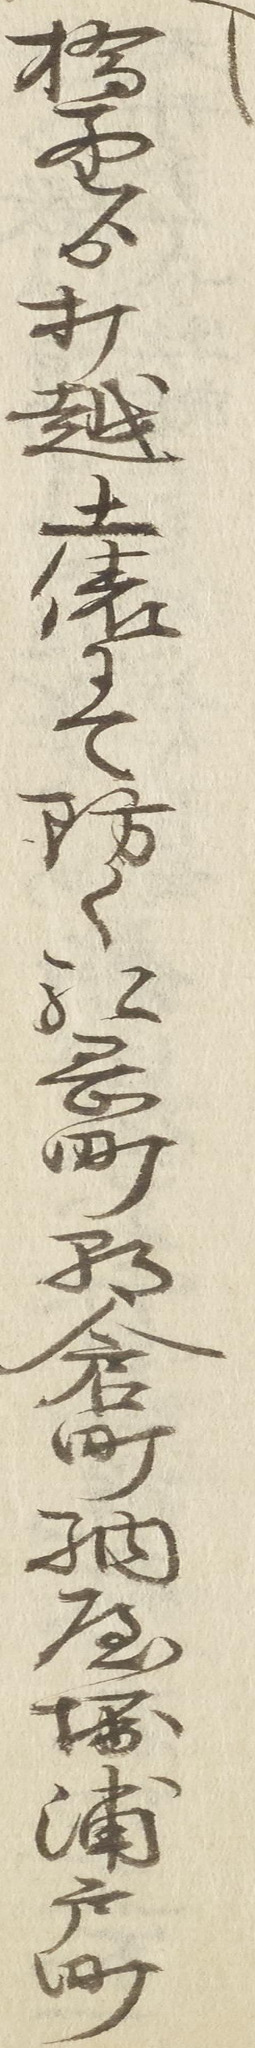橋台より打越土俵にて防く弘岡町朝倉町納屋堀浦戸町
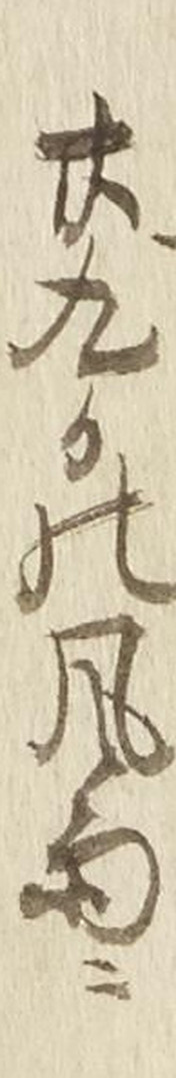廿九日の風雨に
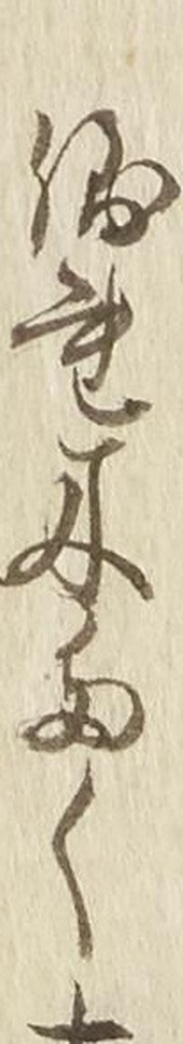倒れ木多く
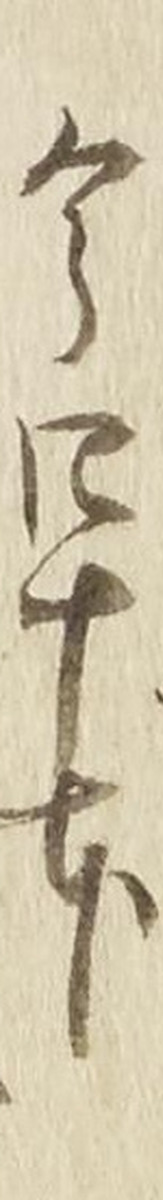今四十本
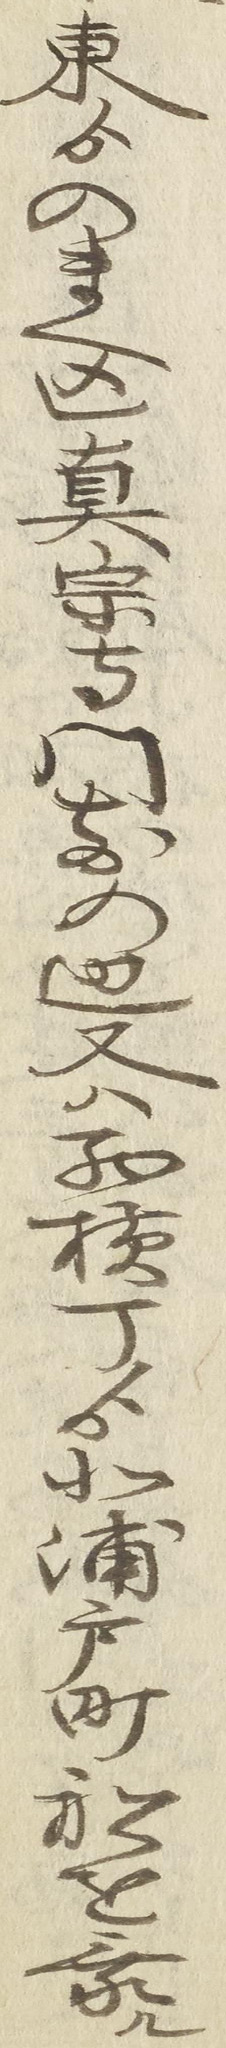東よりのまへ込真宗寺門前の辺又は西横丁より北浦戸町船を乗る
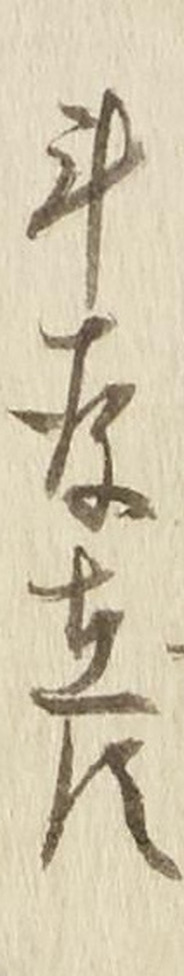斗存在す
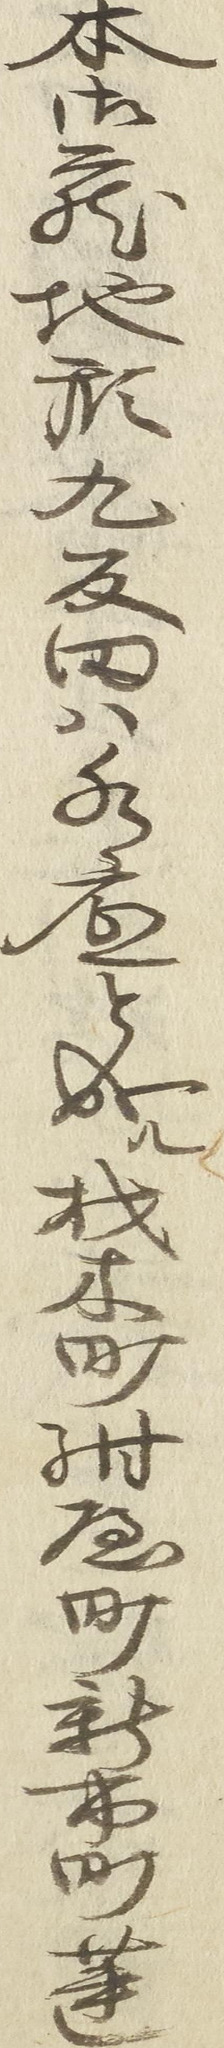本御蔵地形九反田は水底と成る材木町紺屋町新市町連

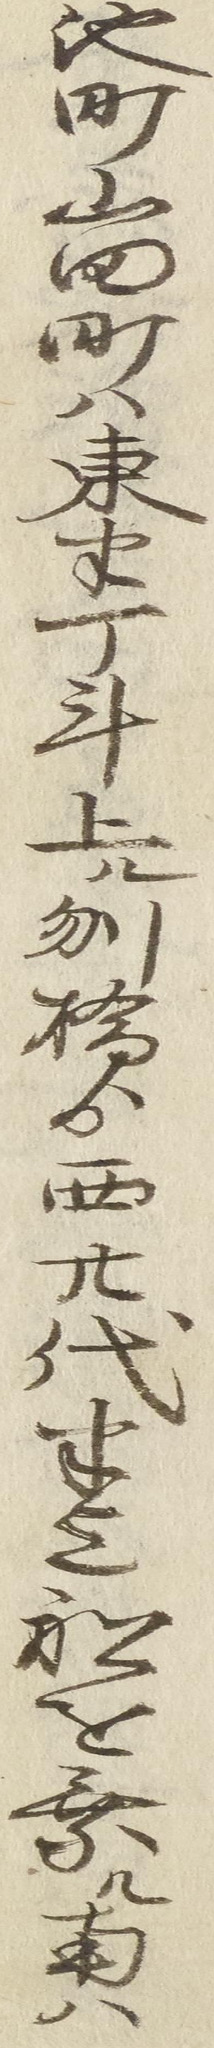池町山田町は東半丁斗上る刎橋より西廿代半迄船を乗る南は
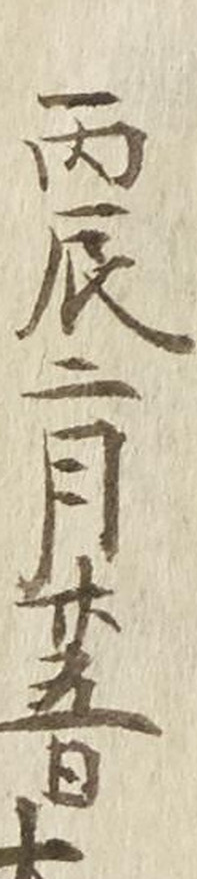丙辰二月廿五日
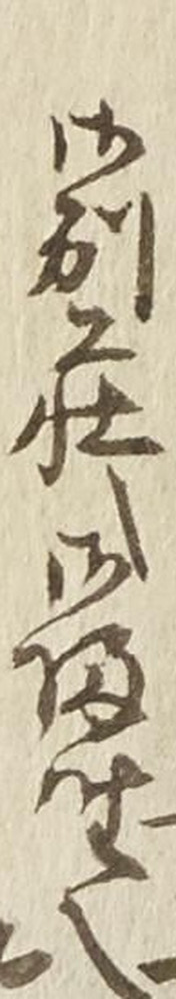御別荘へ御帰座也
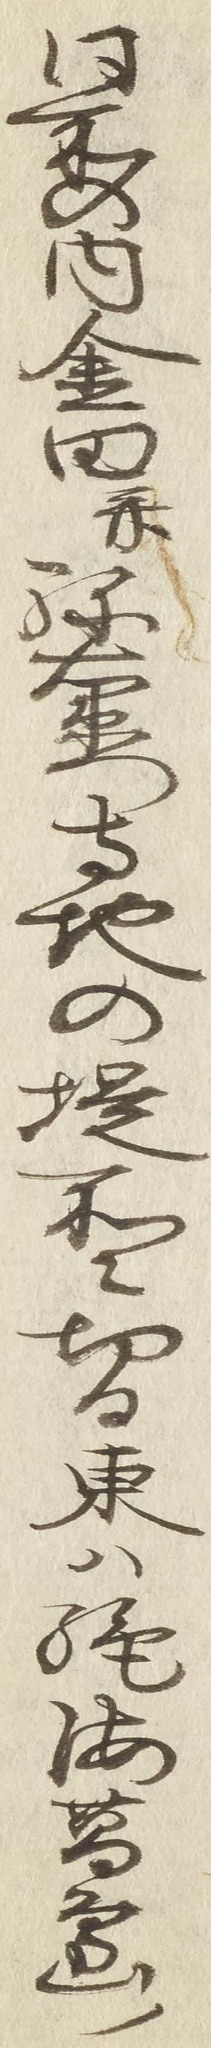同所の内金田幷弥右衛門寺地の提所々切る東は絶海葛島の
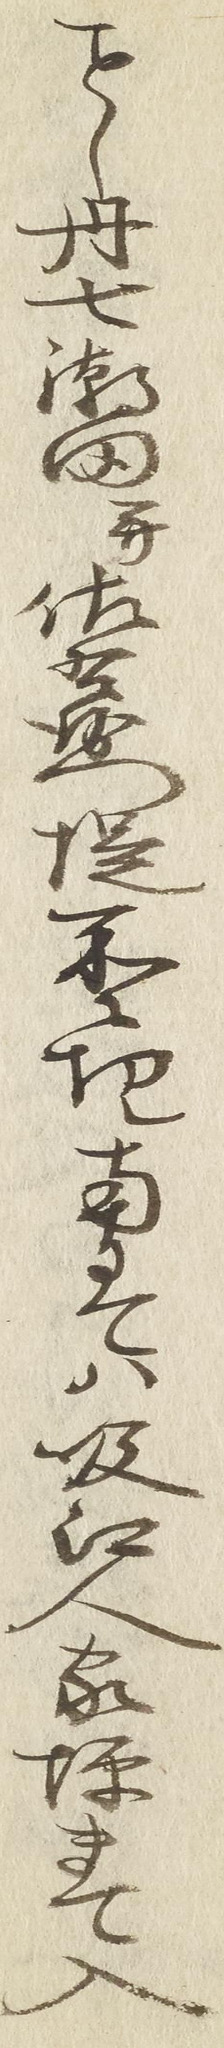ことし丹七潮田幷佐右衛門堤所々切れ南にては吸江人家坪まて入
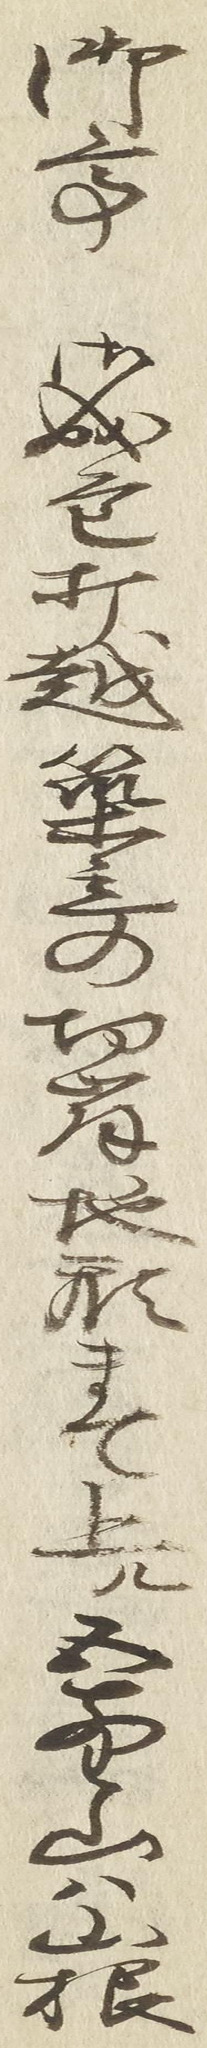御事御成道打越築立の切岸地形まて上る五台山は山根
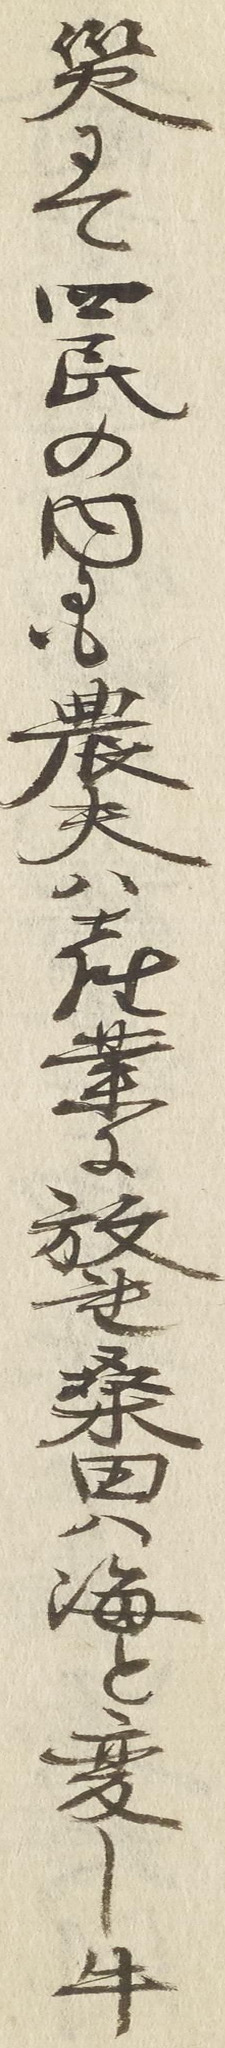災にて四民の内にも農夫は産業に放れ桑田は海と変し牛
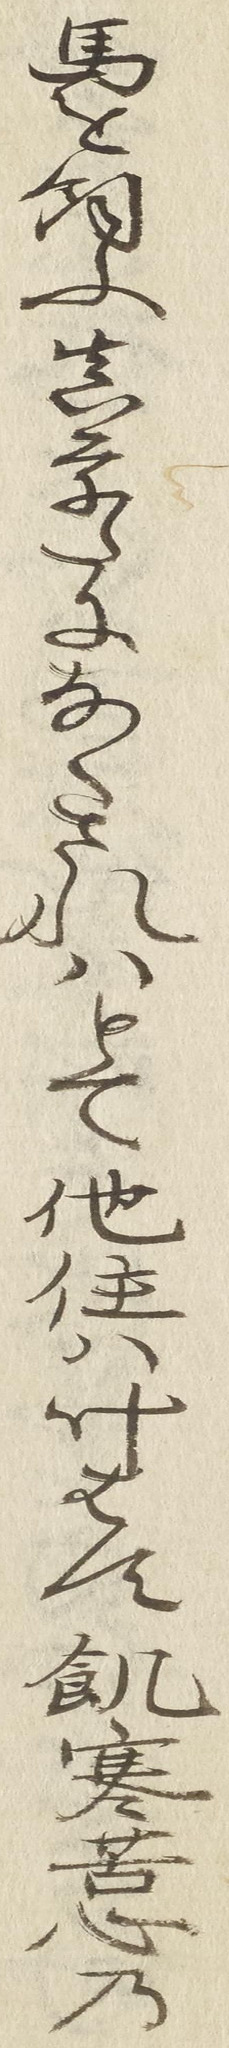馬を飼ふ真草たになくされははとて他住は叶はす飢寒苦心の
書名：地震記　上
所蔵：東京大学地震研究所図書室 Earthquake Research Institute Library, The University of Tokyo, JAPAN
